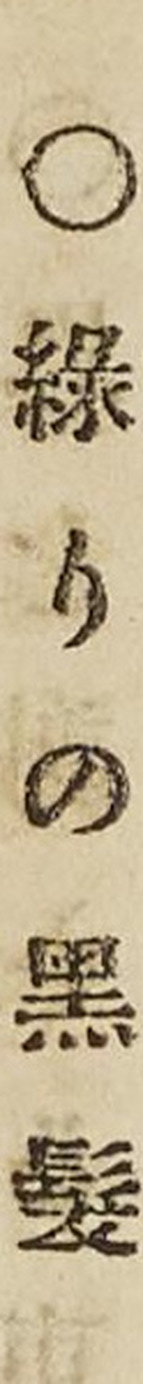○緑りの黒髪
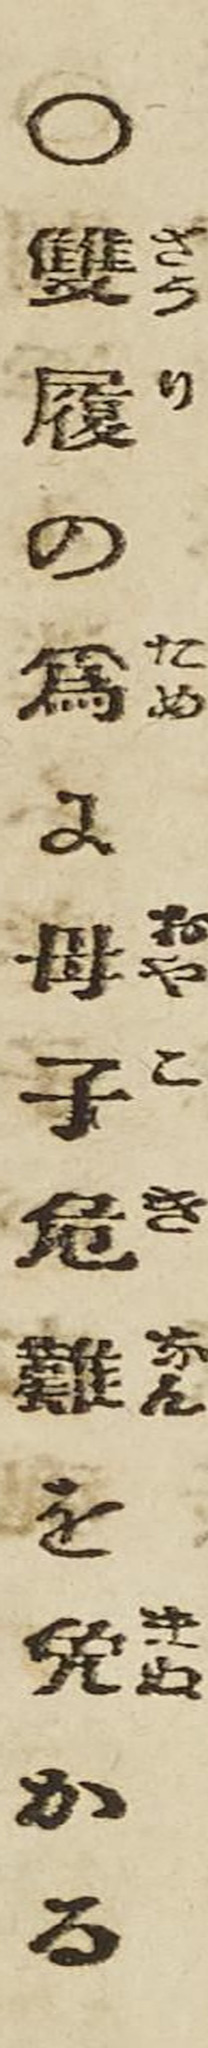○双履の為に母子危難を免かる
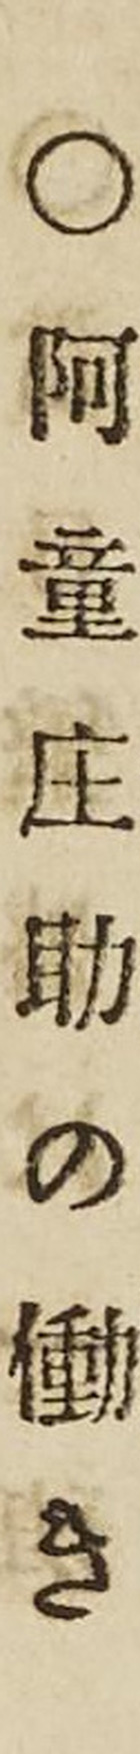○河童庄助の働き
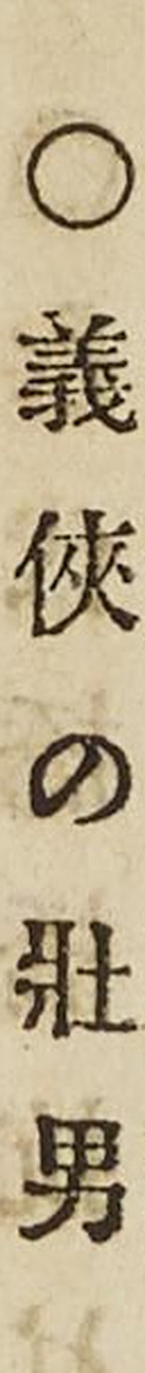○義侠の壮男
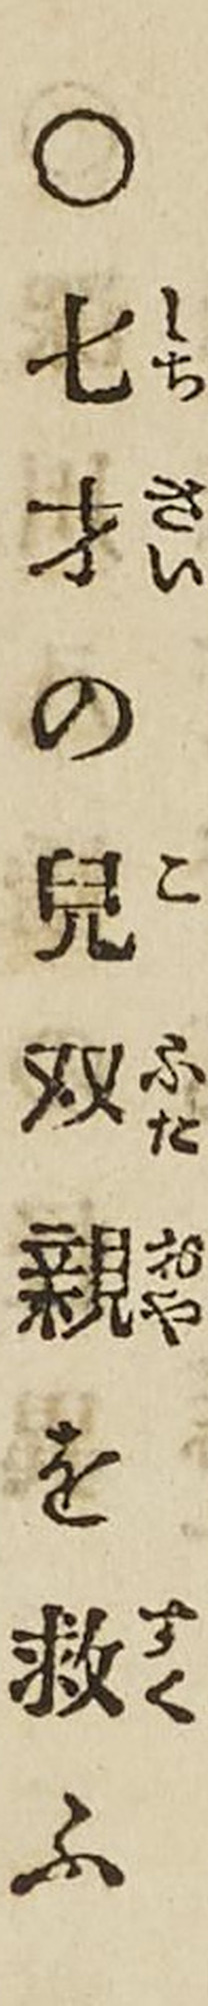○七才の児双親を救ふ
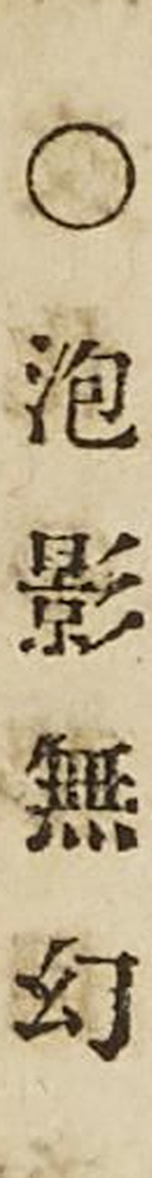○泡影無幻
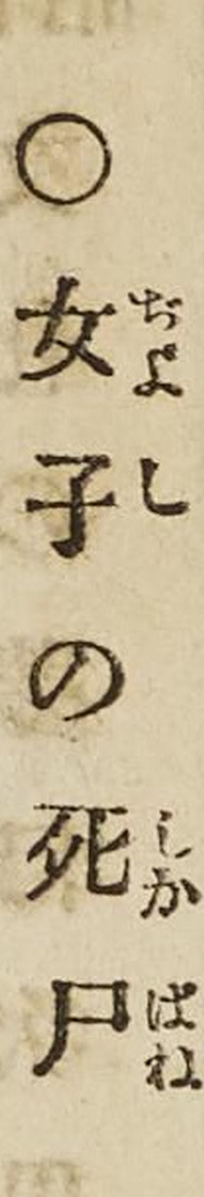○女子の死尸
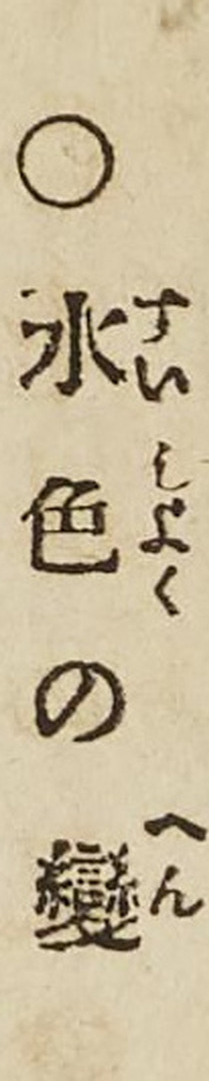○水色の変
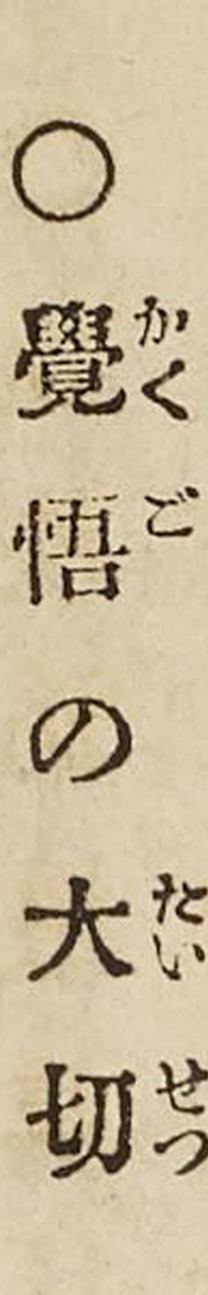○覚悟の大切
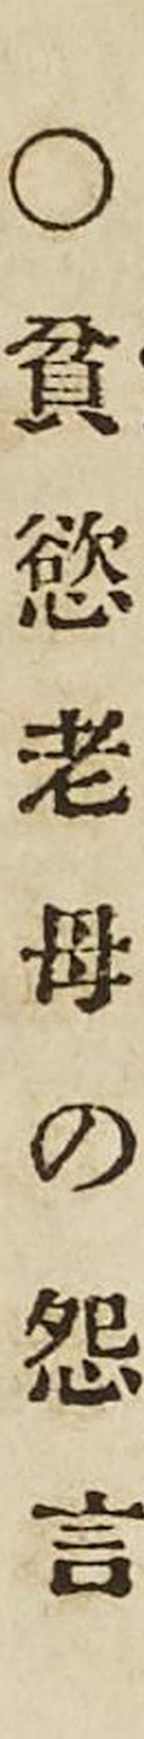○貪欲老母の怨言
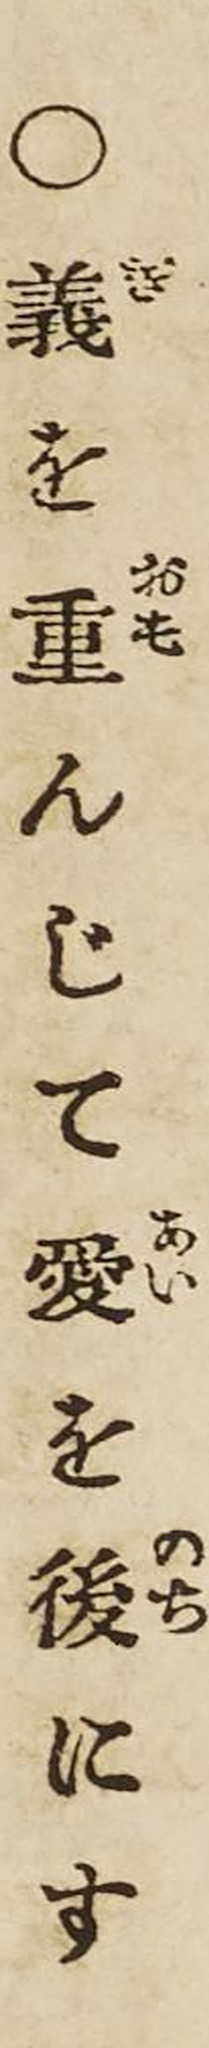○義を重んじて愛を後にす
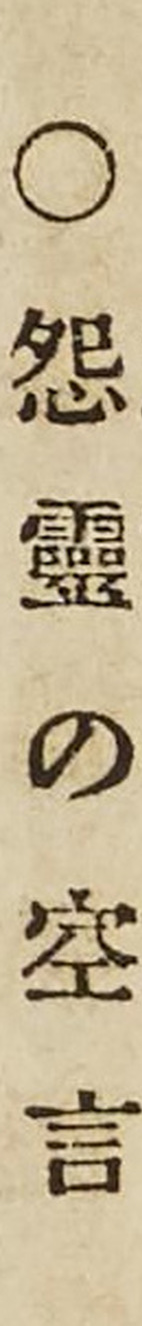○怨霊の空言
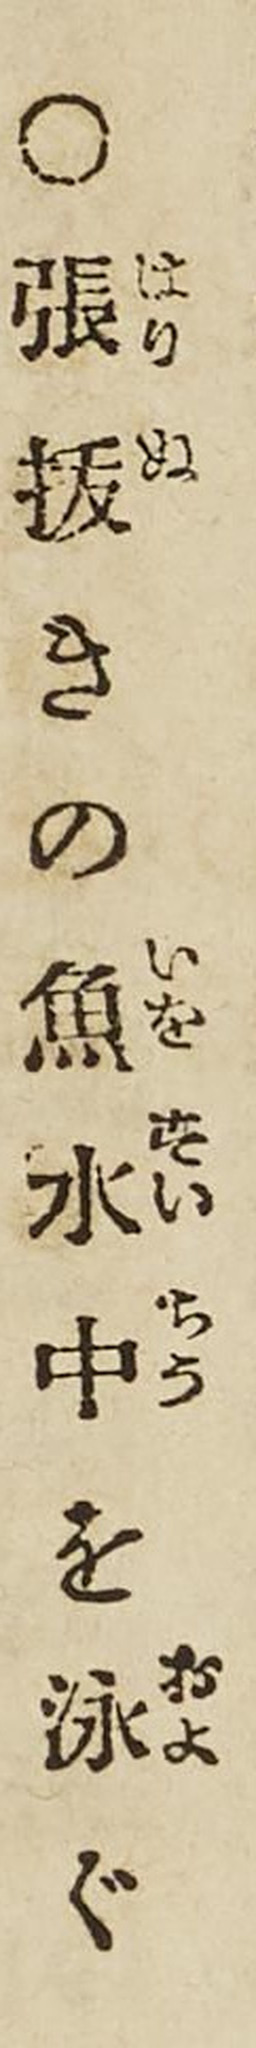○張拔きの魚水中を泳ぐ
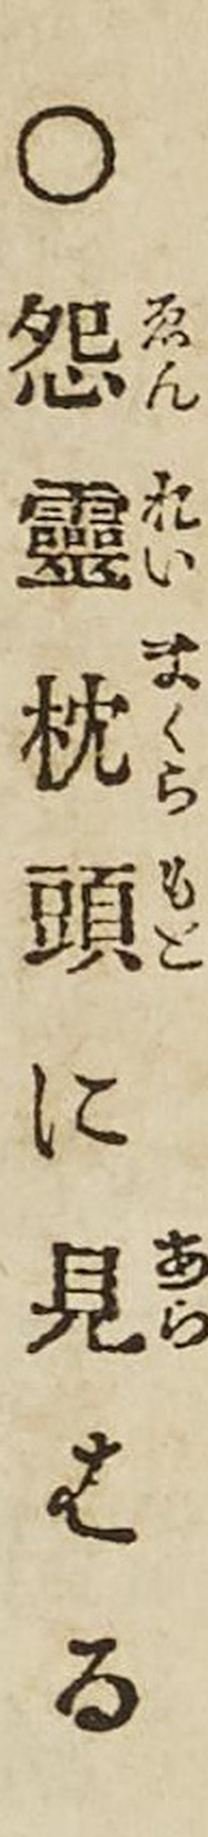○怨霊枕頭に見はる
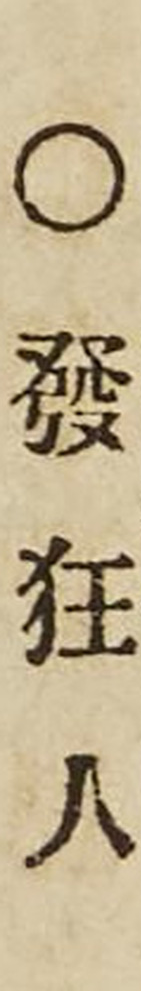○発狂人
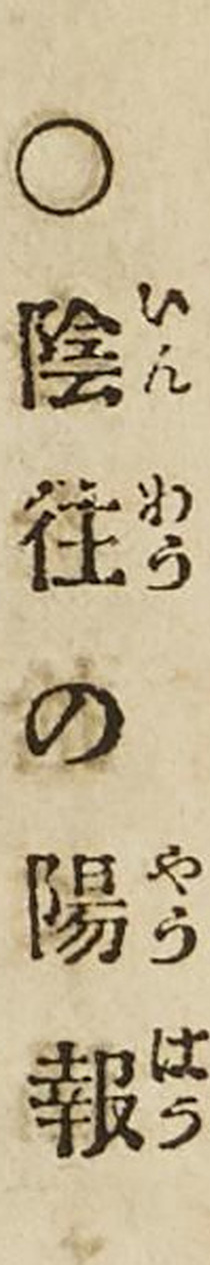○陰往の陽報
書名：永代惨話　文化の夢　全
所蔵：東京大学地震研究所図書室 Earthquake Research Institute Library, The University of Tokyo, JAPAN
